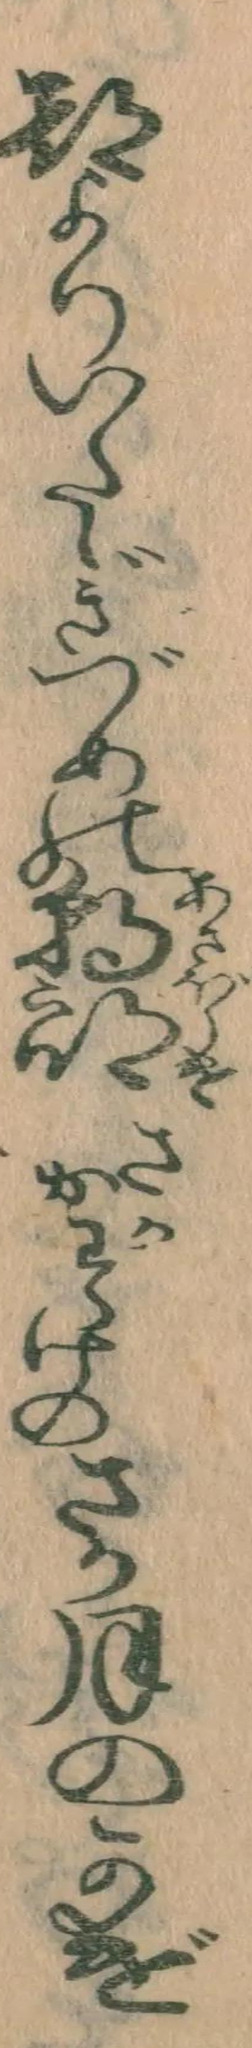都よりいたゞきづめの朝朗さかかわらけさか月のかげ
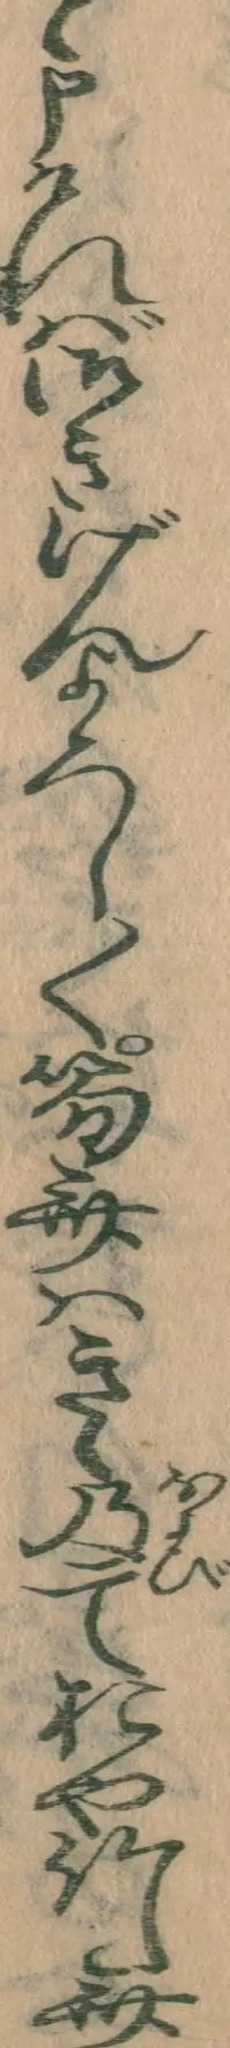と申ければ御きげんよろし〱。筍斎はきゝ及ておや竹斎
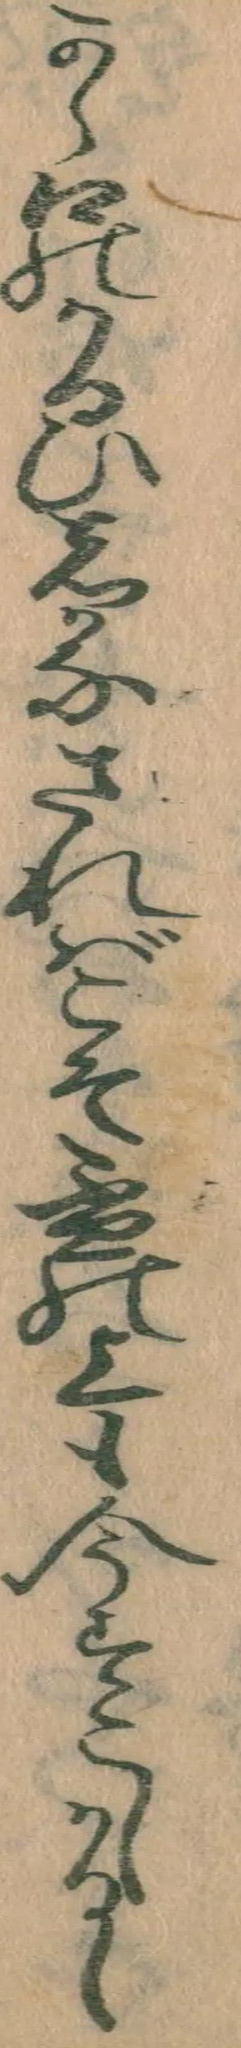から口のかるひ者かなさればこそ杯盃の上も今すこしかるし
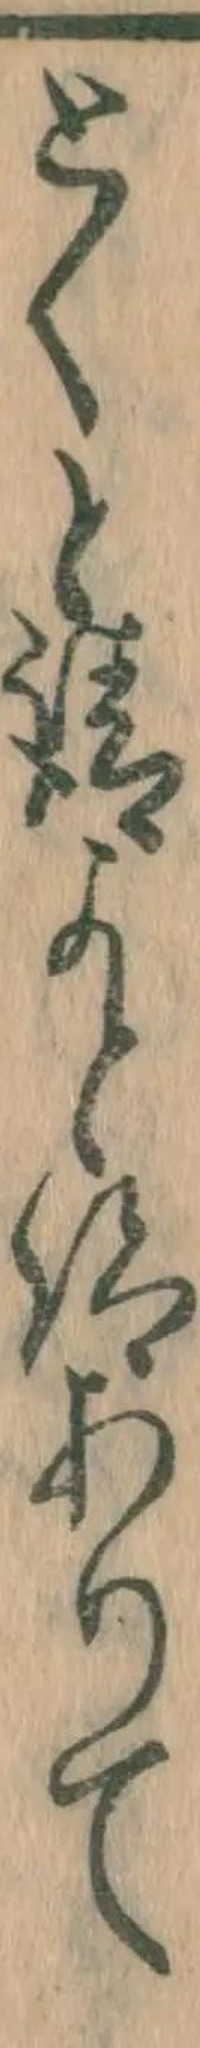とくと請よと仰ありて
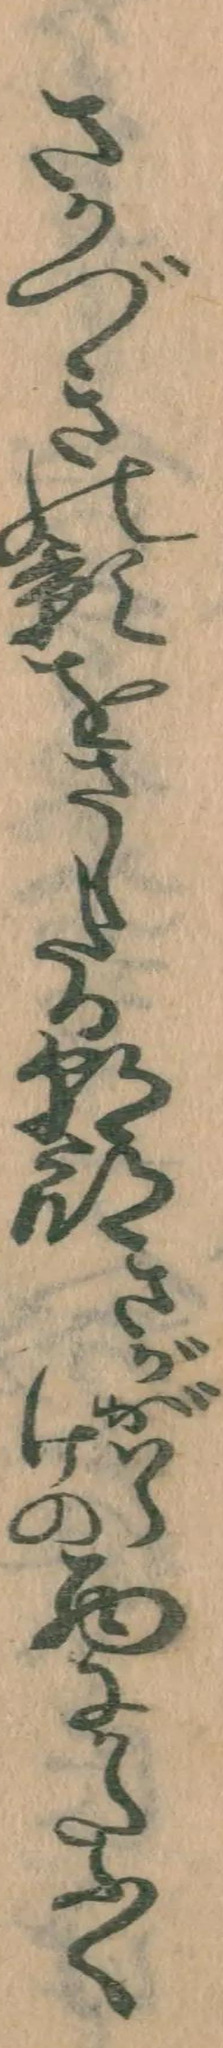さかづきの影をさしたる朝朗さががはらけの西にかたふく
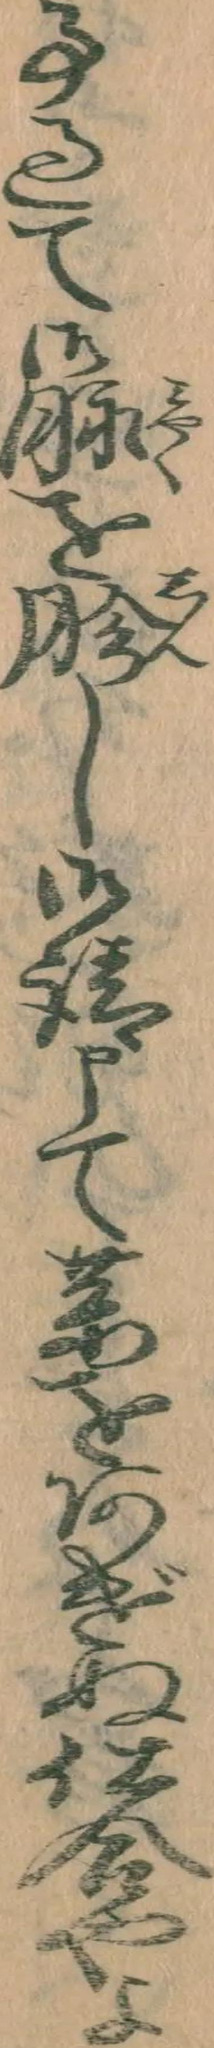事過て御脈を胗し御請申て薬をあげぬ仕合やよ
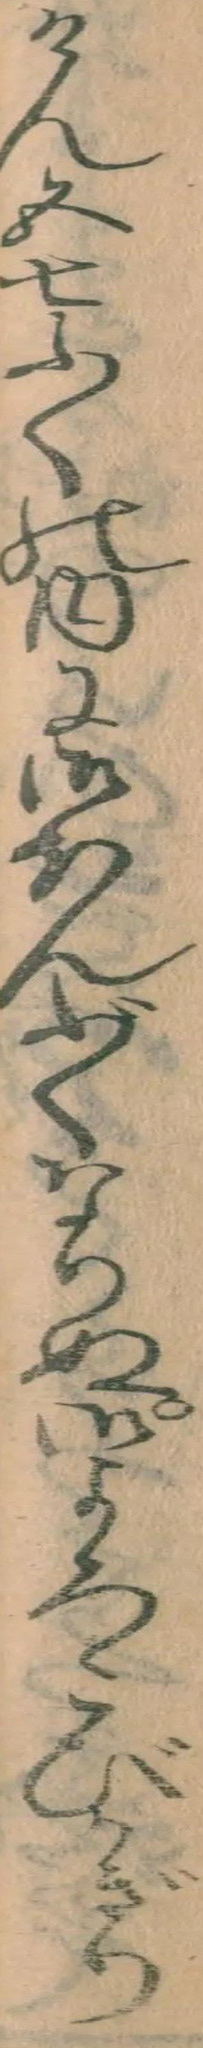けん五七ふくの内に御ほんぶくなりぬ。御よろこびかぎり
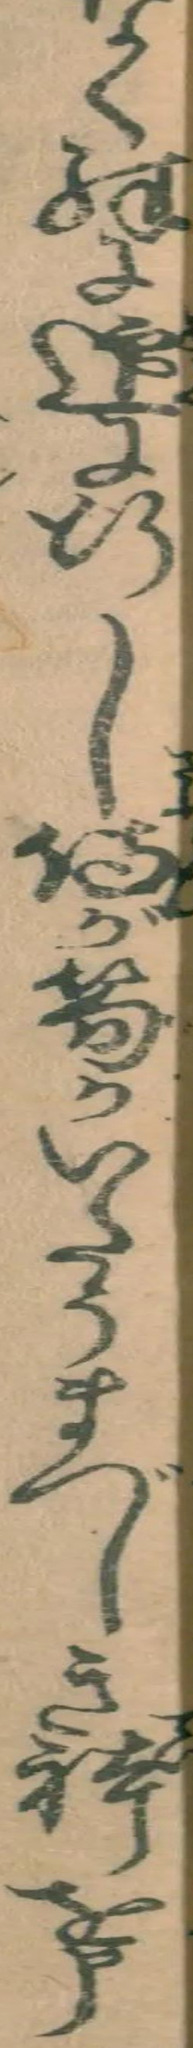なく殊に迎に行し侍が筍かいたうまづしき体を申
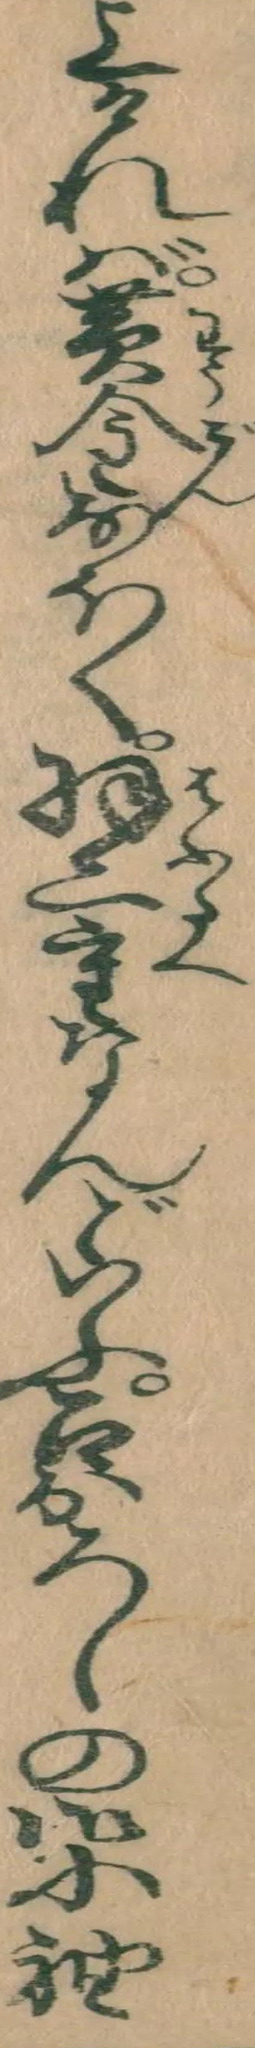上ければ。黄金おほく。羽二重なんどいふ。召おろしの御小袖
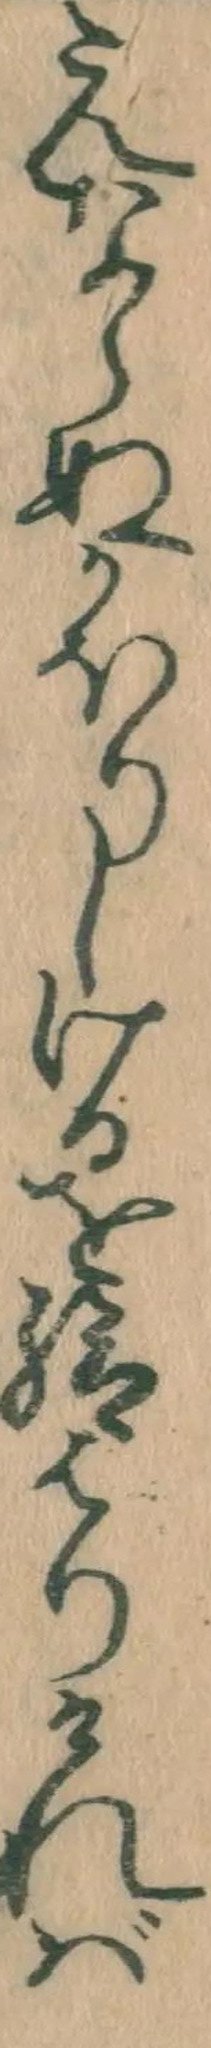えならぬかほりしけるを給はりければ
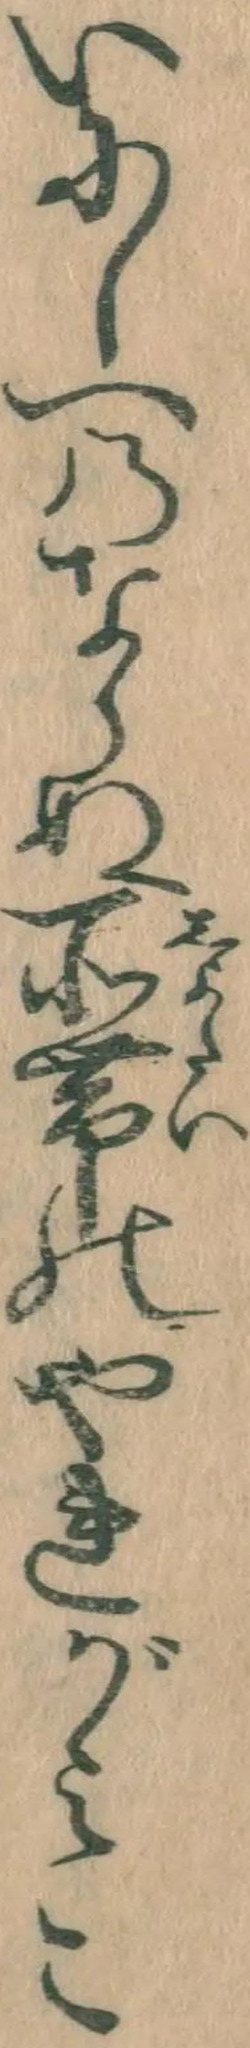いにしへのならぬ所帯のやれがみこ
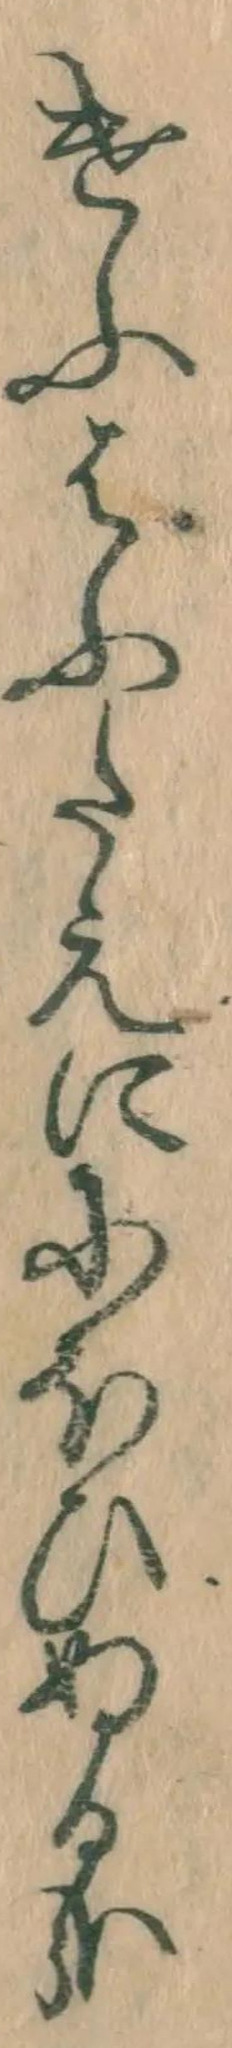けふはふたえににほひぬる哉
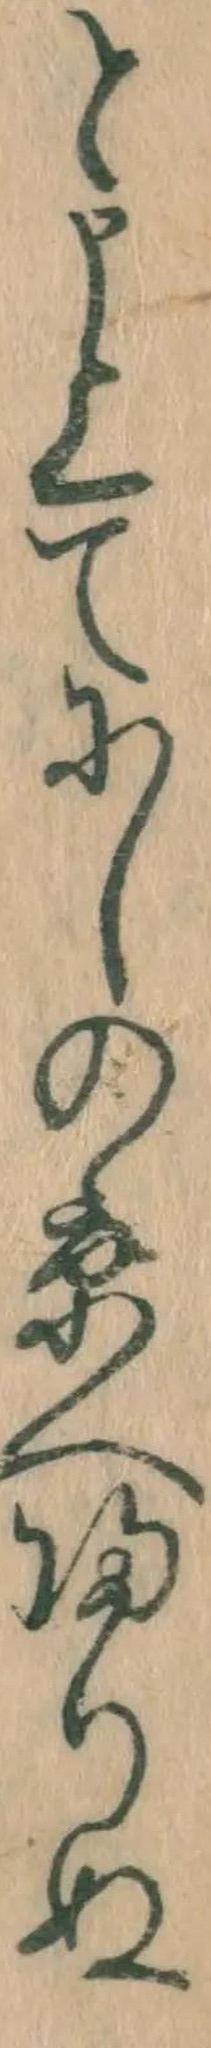と申上てにしの京へ帰りぬ
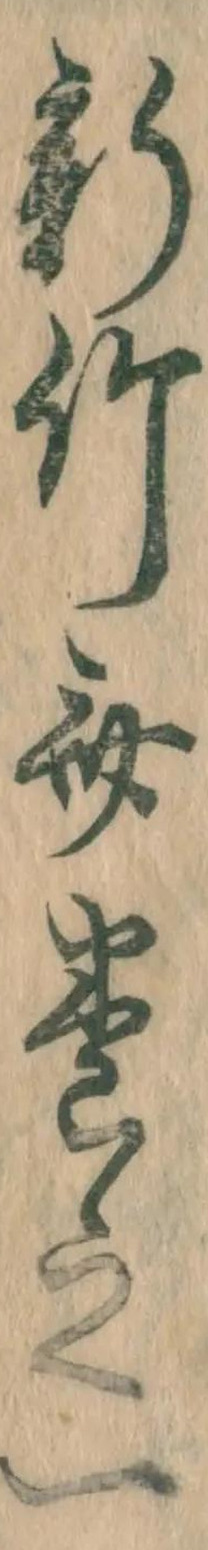新竹斎巻之一

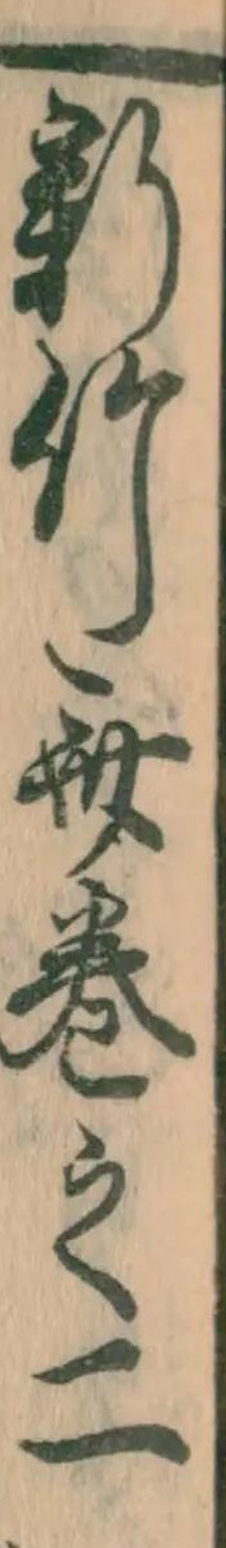新竹斎巻之二
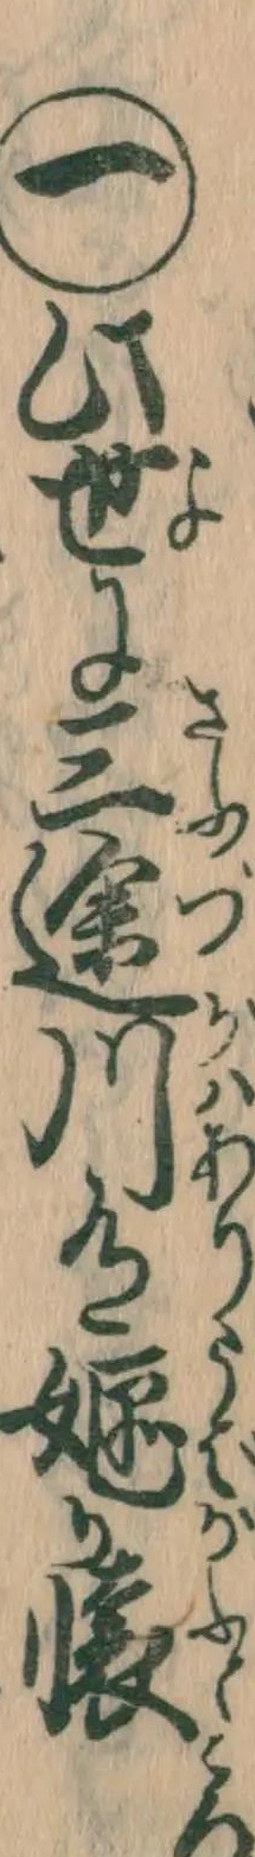一此世に三途川有姥か懐
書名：新竹斎 5巻
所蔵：国立国会図書館 National Diet Library, JAPAN
